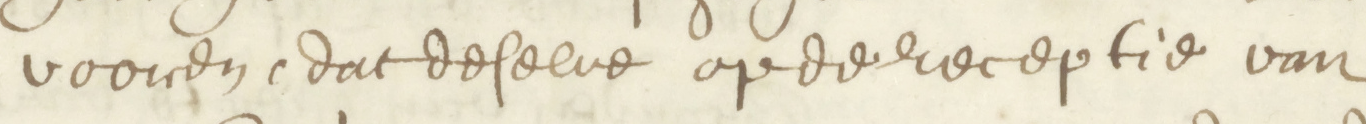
vooren, dat deselve opde receptie van
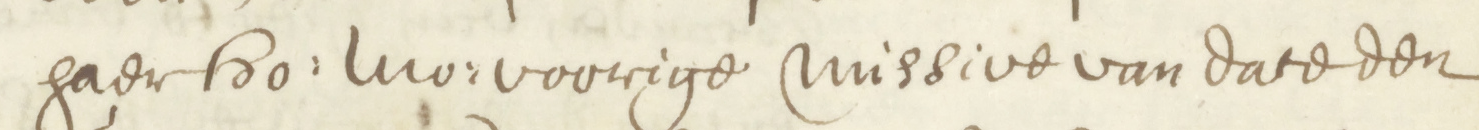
haer ho:mo: voorige missive van date den
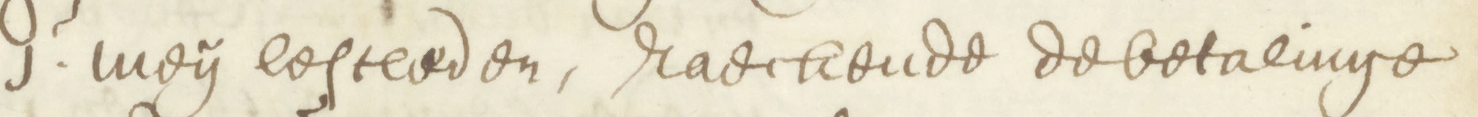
1e. meij lestleden, raeckende de betalinge
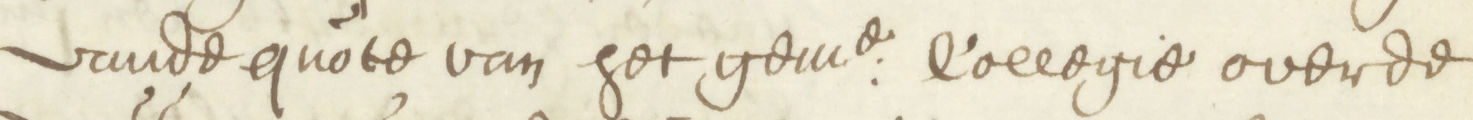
vande quote van het geme. Collegie over de
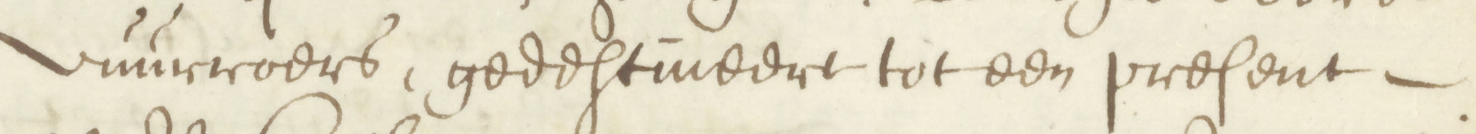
vuurroers, gedestineert tot een present —
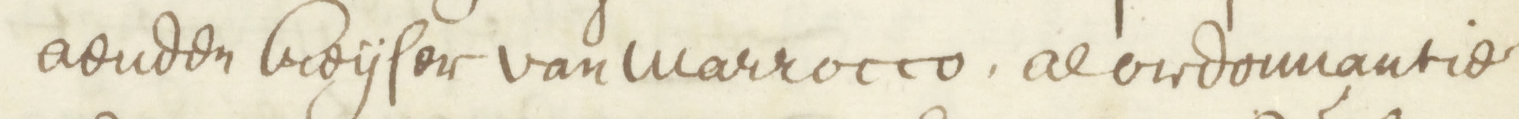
aenden Keijser van marrocco, al ordonnantie
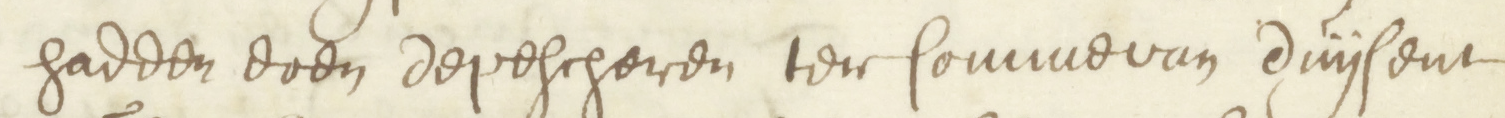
hadden doen depescheren ter somme van duijsent
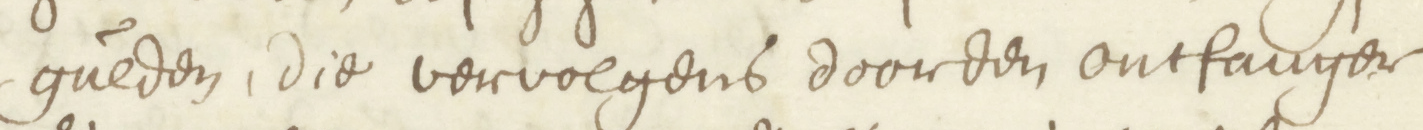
gulden, die vervolgens door den ontfanger
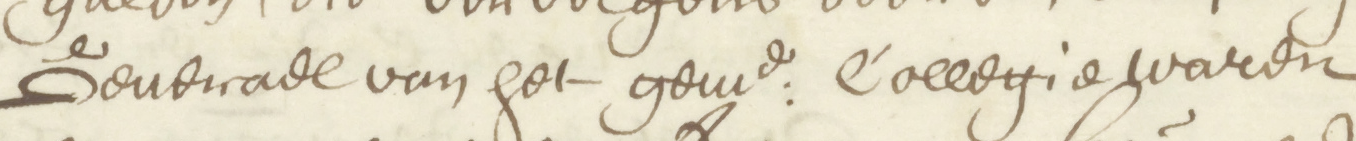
Generael van het geme. Collegie waren
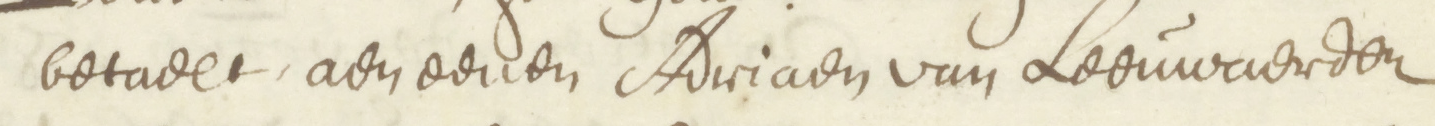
betaelt, aen eenen Adriaen van Leeuwaerden
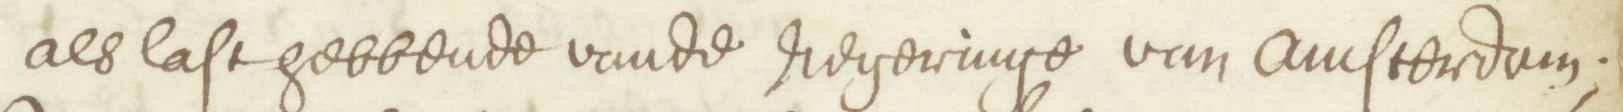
als last hebbende vande regeringe van amsterdam;
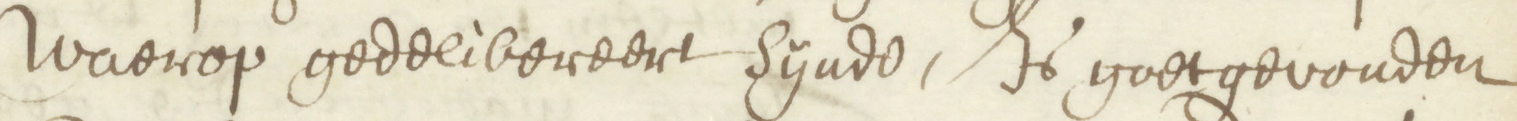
Waerop gedelibereert sijnde, Is goetgevonden
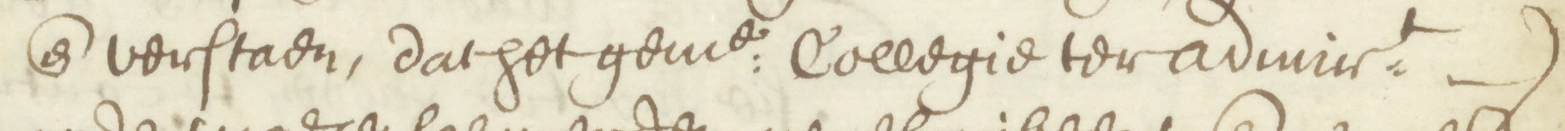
& verstaen, dat het geme: Collegie ter admirt. —
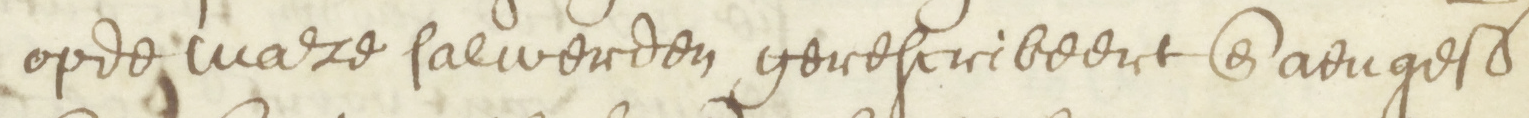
opde maze sal werden gerescribeert & aengess.
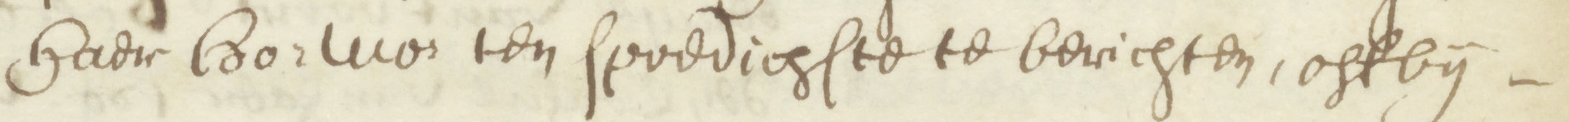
haer ho:mo: ten spoedichste te berichten, off bij —
